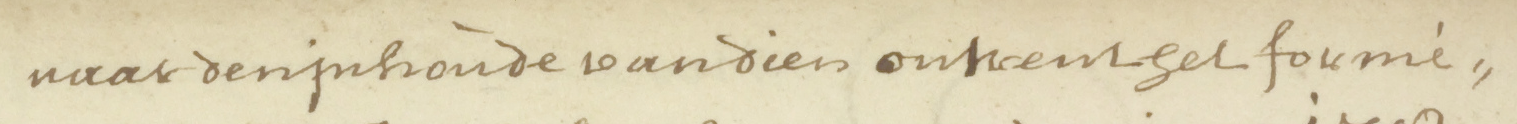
naar den inhoude vandien ontrent het forme„
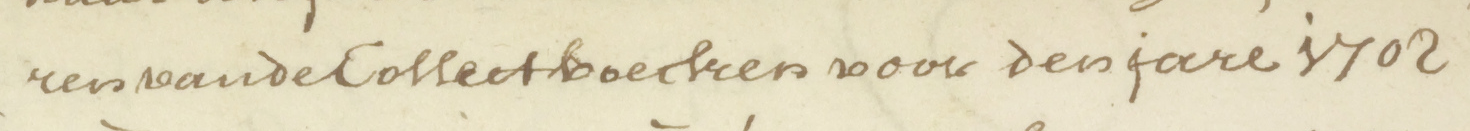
ren vande Collectboecken voor den jare 1702
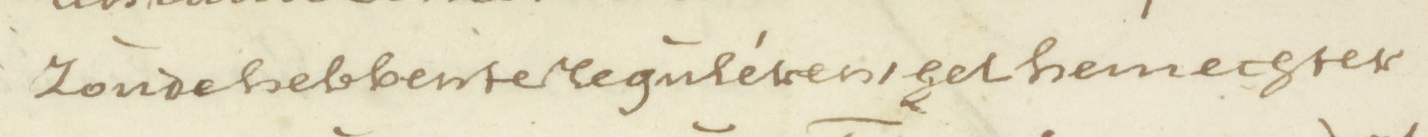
zoude hebben te reguleren, het hem echter
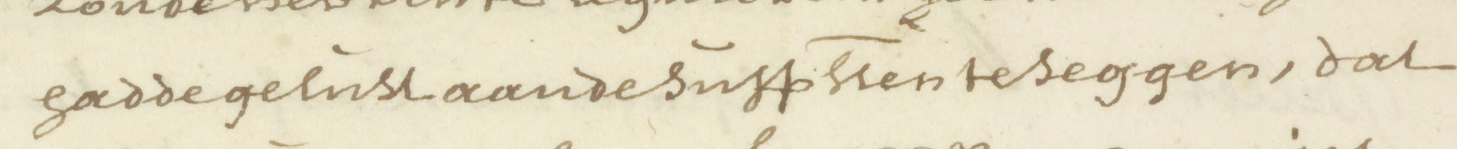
hadde gelust aande supplten te seggen, dat
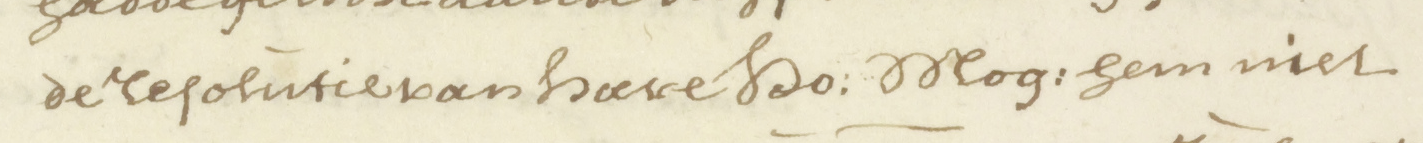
de resolutie van hare Ho:Mog: hem niet
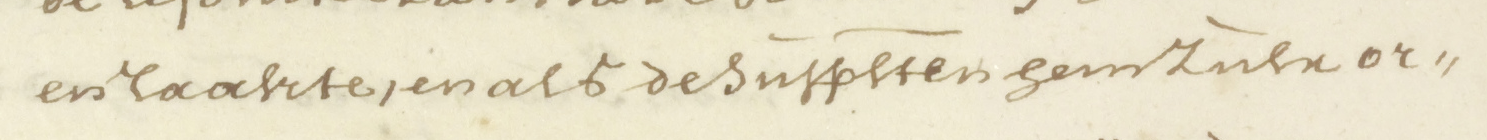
en raakte, en als de supplten hem zulx or„
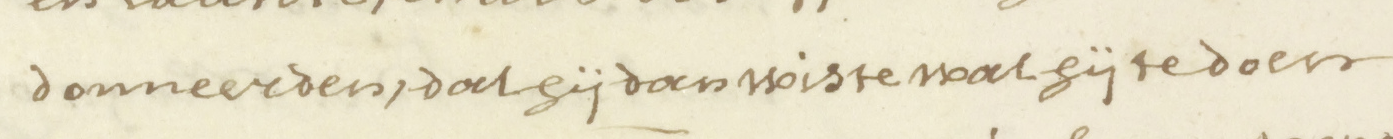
donneerden, dat hij dan wiste wat hij te doen
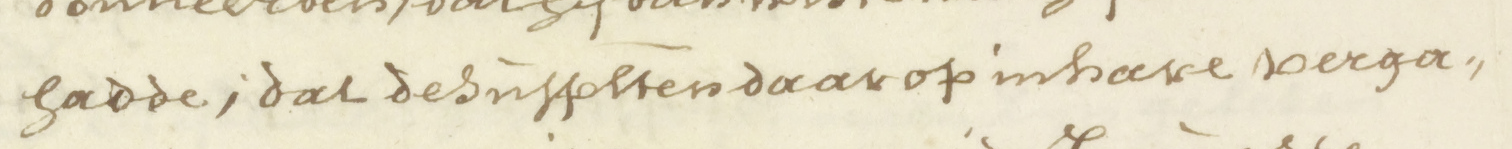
hadde, dat de supplten daar op in hare verga„
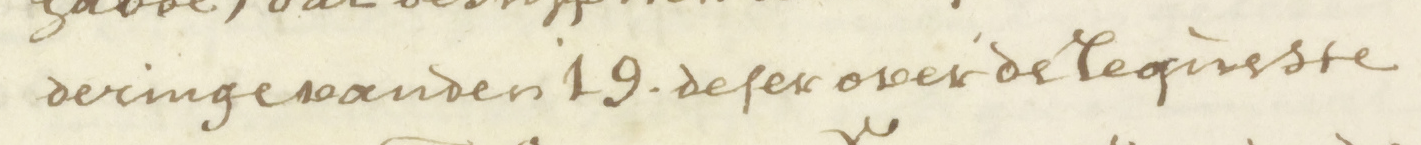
deringe vanden 19. deser over de requeste
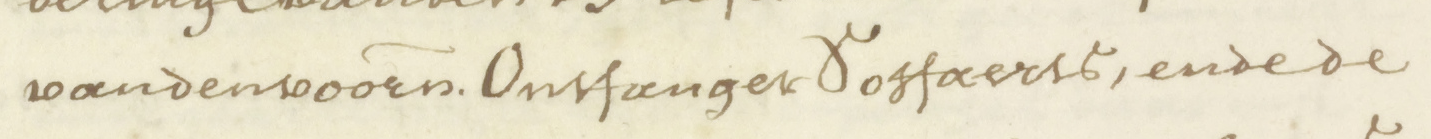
vanden voorn. Ontfanger Sossaerts, ende de
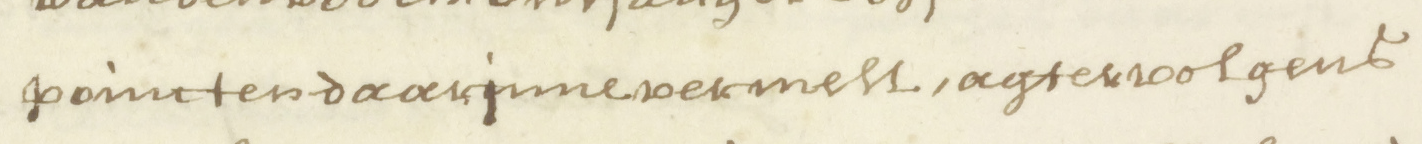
poincten daarinne vermelt, agtervolgens
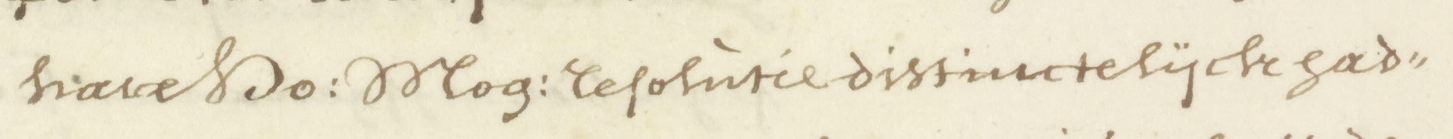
hare Ho:Mog: resolutie distinctelijck had„,
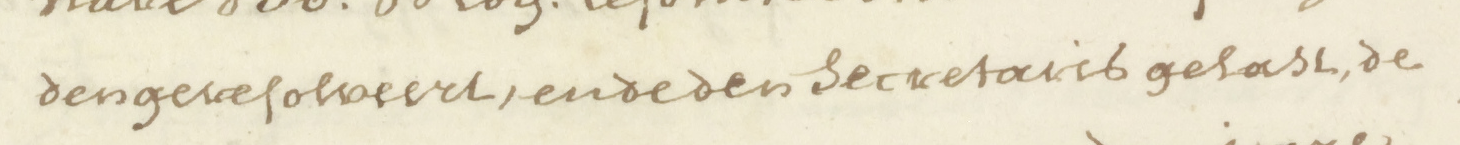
den geresolveert, ende den secretaris gelast, de
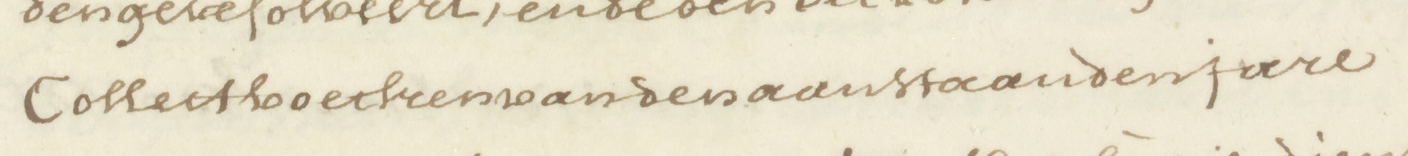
Collectboecken van den aanstaanden jare
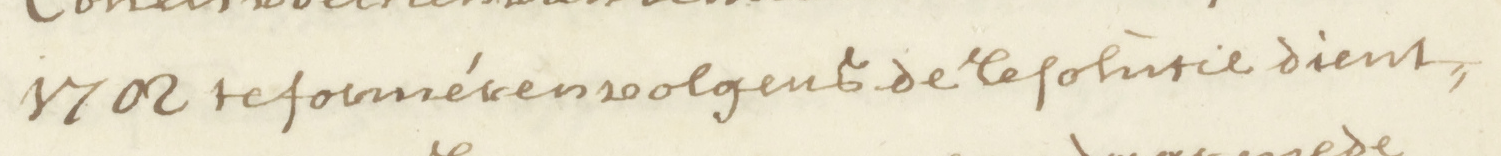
1702 te formeren volgens de resolutie dient,,
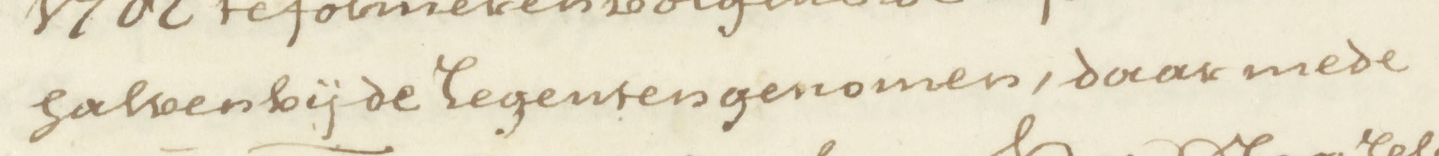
halven bij de regenten genomen, daar mede
